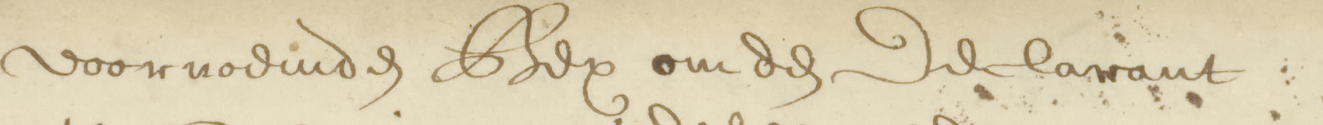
voornoemden Bex om den Declarant
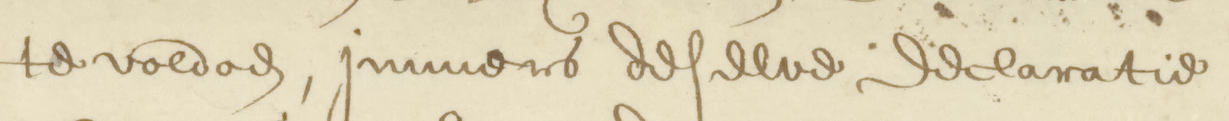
te voldoen, immers deselve Declaratie
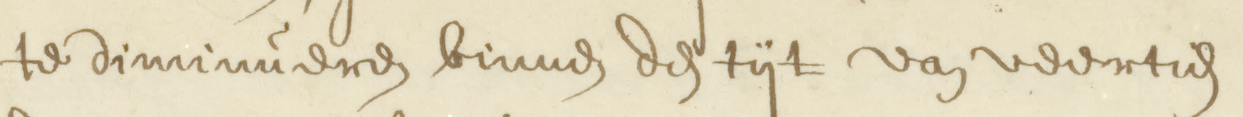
te diminueren binnen den tijt van veertien
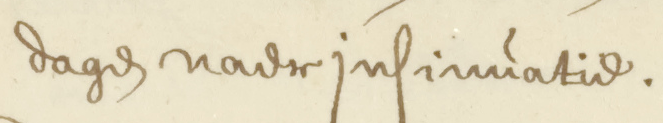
dagen naer insinuatie.
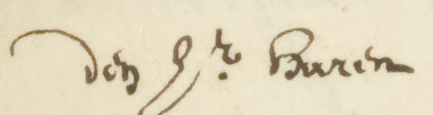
den hr. Haren
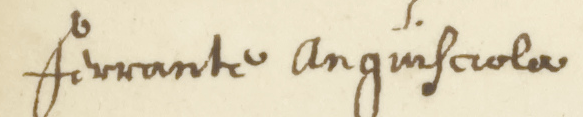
Ferrante Anguisciola
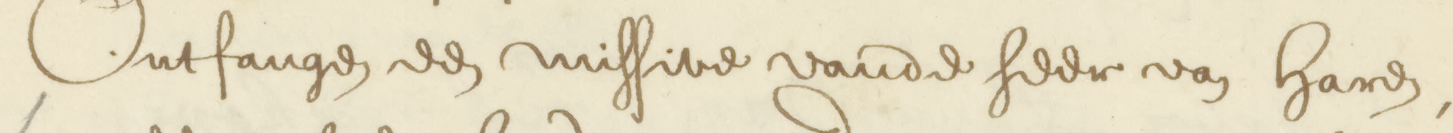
Ontfangen een missive vande heer van Haren,
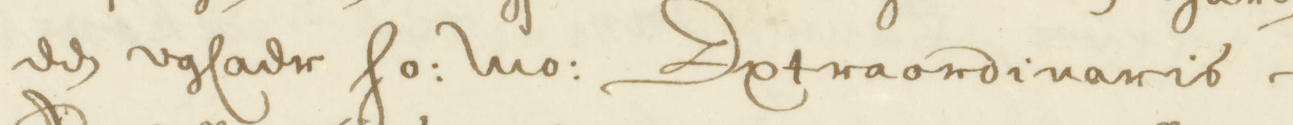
een van haer ho:Mo: Extraordinaris
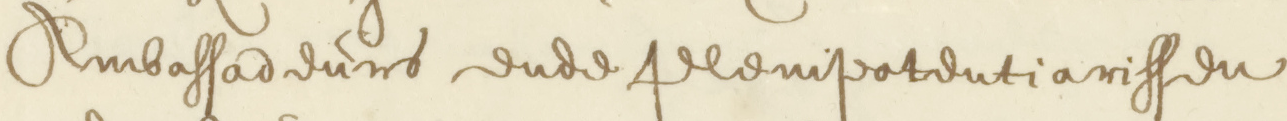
Ambassadeurs ende Plenipotentiarissen
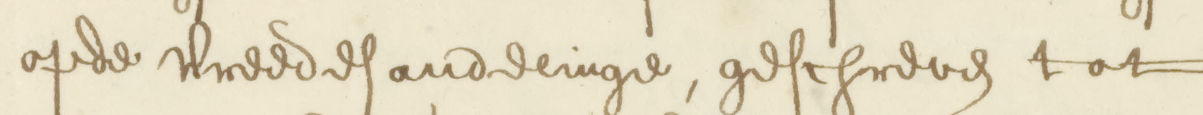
opde Vreedehandelinge, geschreven tot
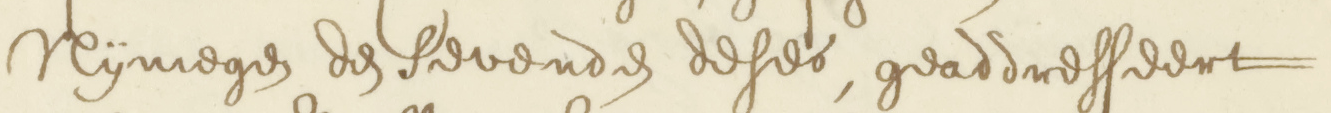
Nijmegen den sevenden deses, geaddresseert
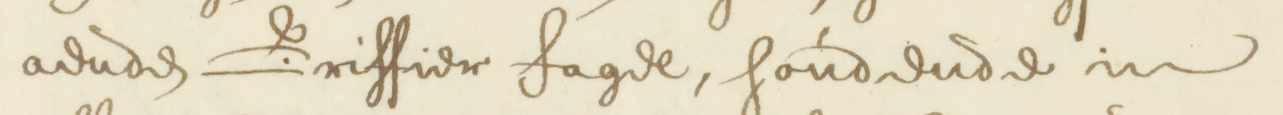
aenden Griffier Fagel, houdende in
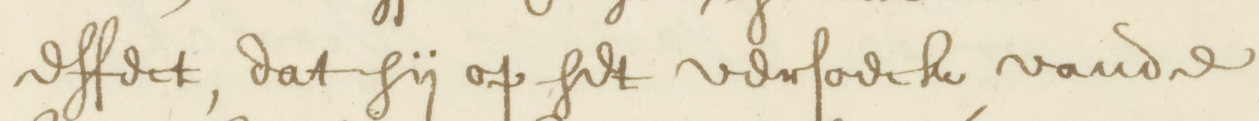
effect, dat hij op het versoeck vande
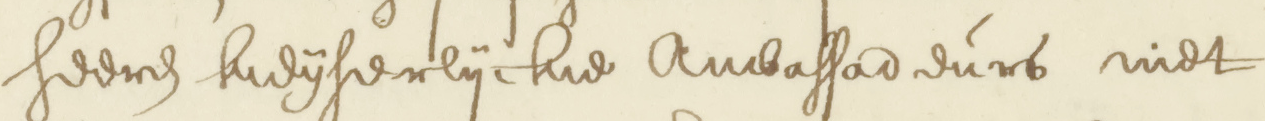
heeren keijserlijcke Ambassadeurs niet
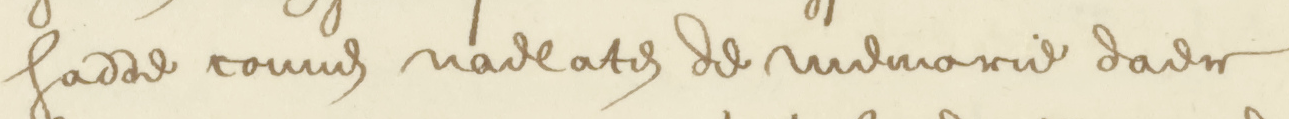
hadde connen naelaten de memorie daer
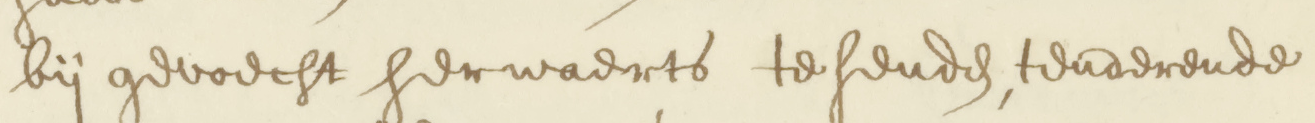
bij gevoecht herwaerts te senden, tenderende
